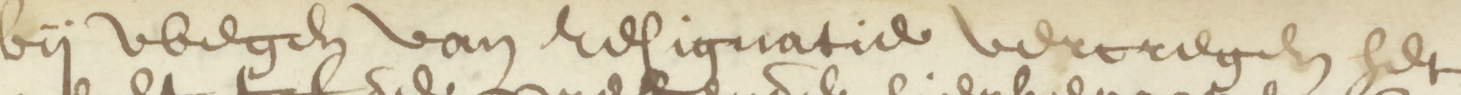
bij wegen van resignatie vercregen het
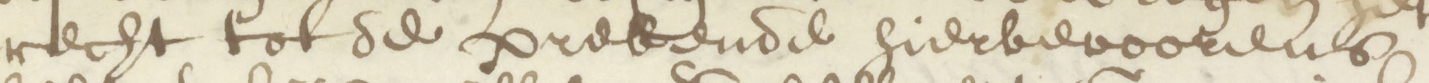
recht tot de prebende hierbevoorens
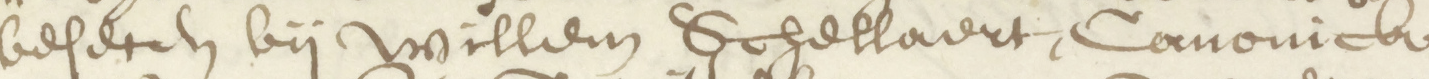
beseten bij Willem Schellaert, Canonick
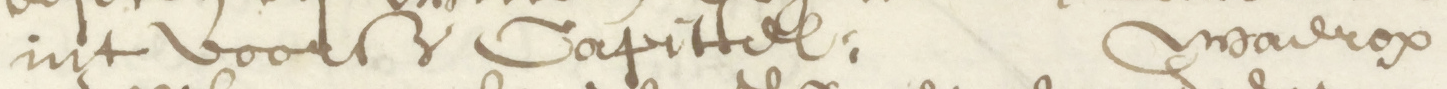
int voors Capittel: Waerop
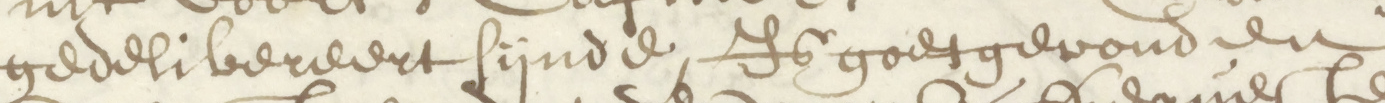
gedelibereert sijnde, Is goetgevonden
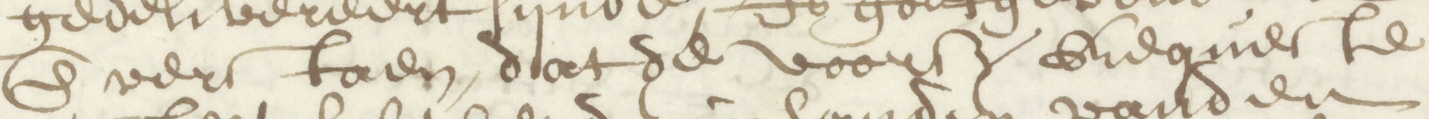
& verstaen, dat de voors Requeste
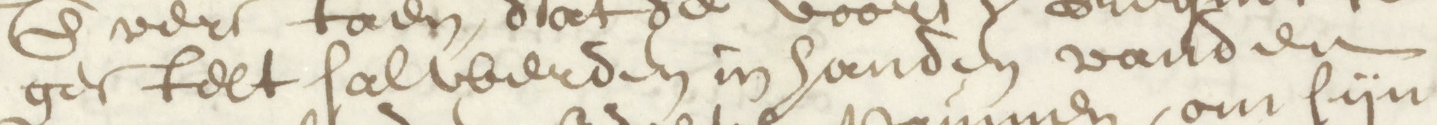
gestelt sal werden in handen vanden
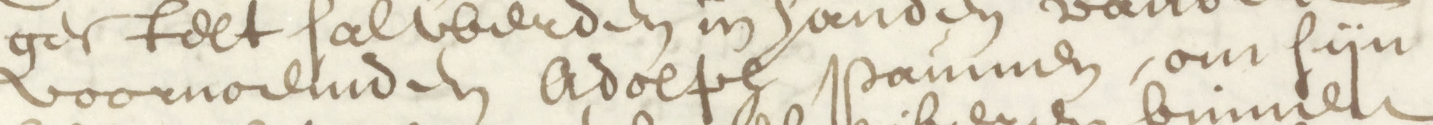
voornoemden Adolph Paumen, om sijn
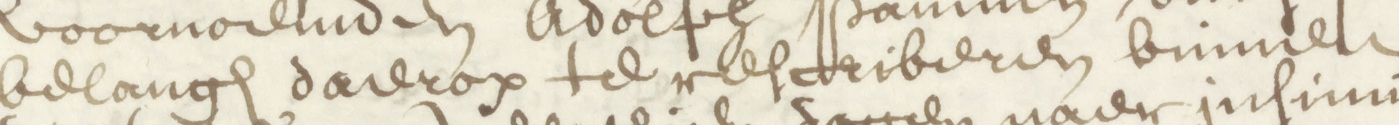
belangh daerop te rescriberen binnen
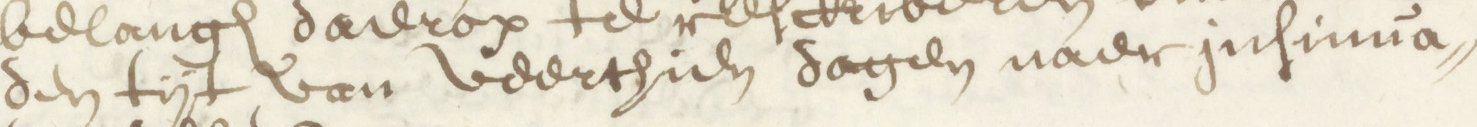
den tijt van veerthien dagen naer insinua„
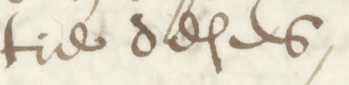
tie deses.
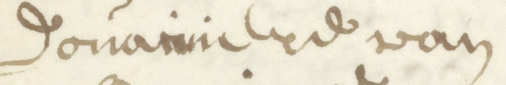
Douairiere van
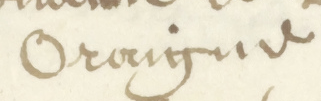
Oraigne
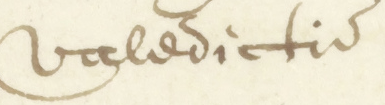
valedictie
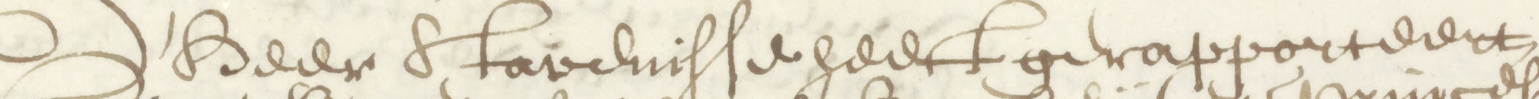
D'Heer Stavenisse heeft gerapporteert,
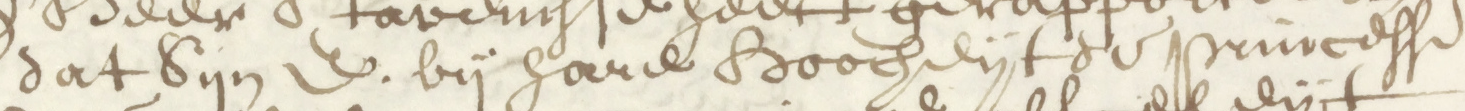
dat Sijn E. bij hare Hoocheijt de Princesse
